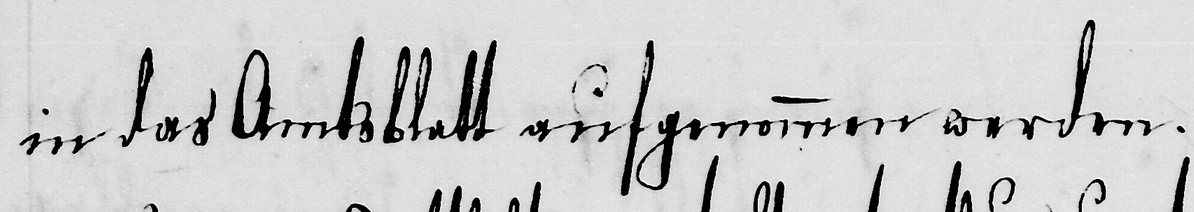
in das Amtsblatt aufgenommen werden.
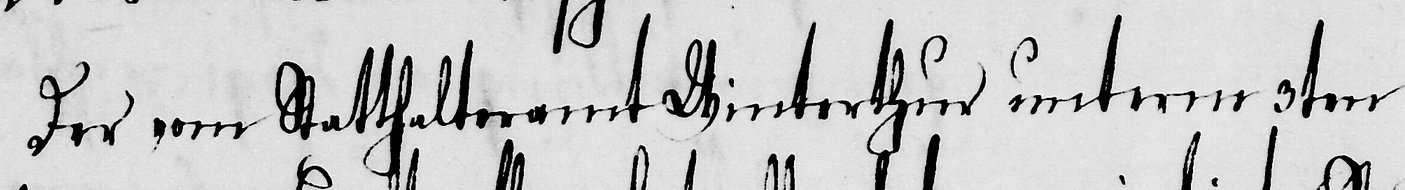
Der vom Statthalteramt Winterthur unterm 3ten
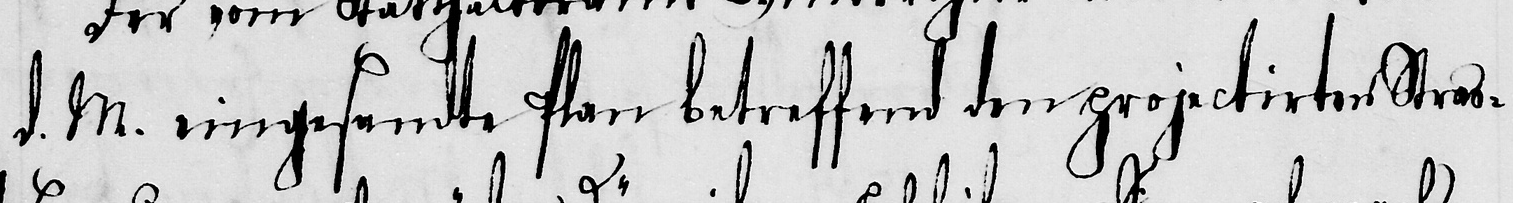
d. M. eingesandte Plan betreffend den projectirten Straß¬
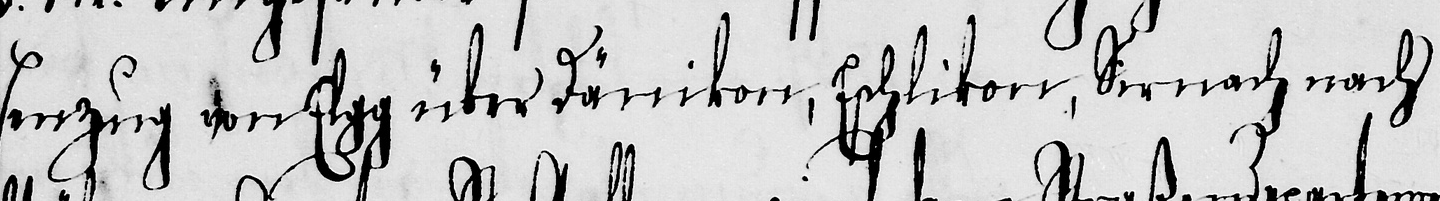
enzug von Elgg über Dänikon, Eschlikon, Sirnach nach
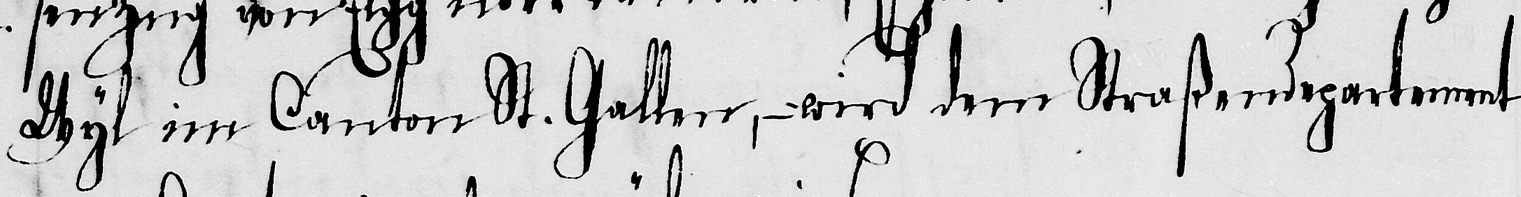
Wyl im Canton St. Gallen, – wird dem Straßendepartement
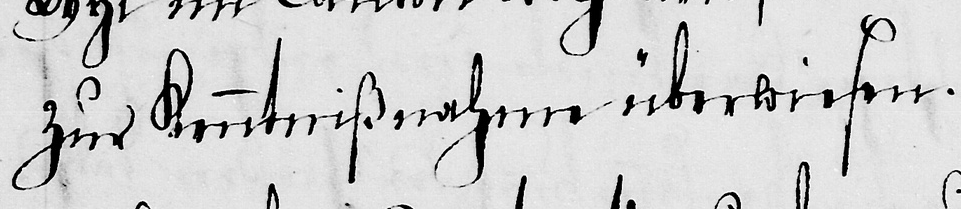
zur Kenntnißnahme überwiesen.
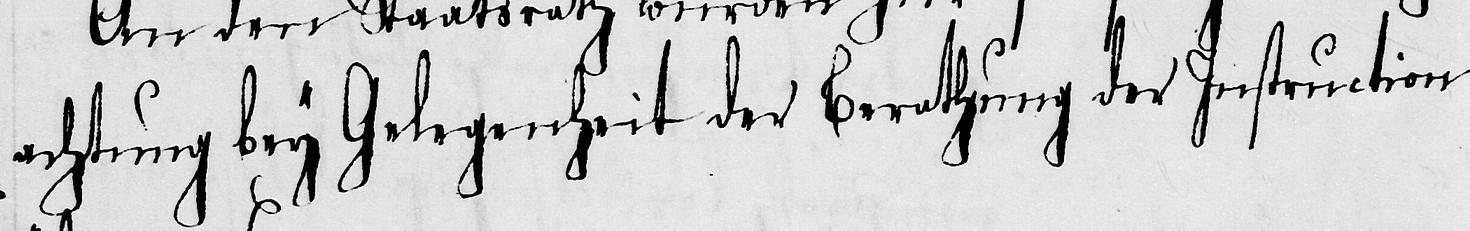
achtung bey Gelegenheit der Berathung der Instruction
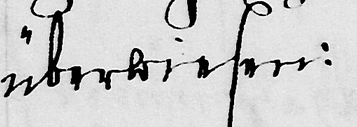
überwiesen:
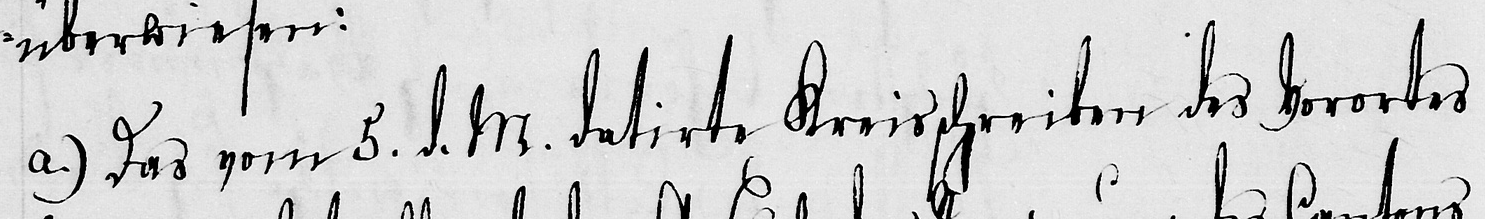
a.) Das vom 5. d. M. datirte Kreisschreiben des Vorortes
